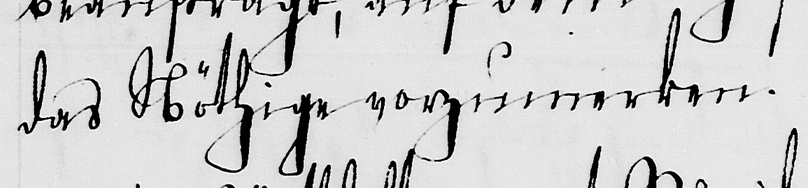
das Nöthige vorzumerken.
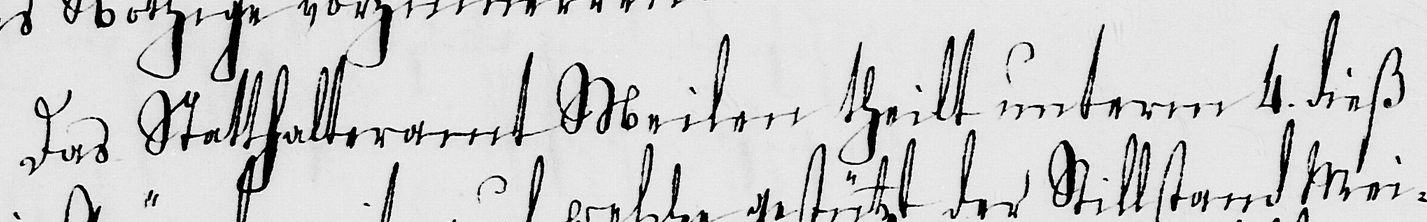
Das Statthalteramt Meilen theilt unterm 4. dieß
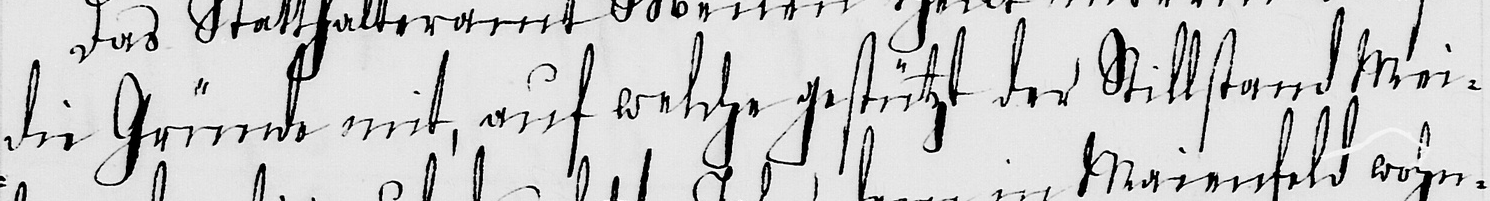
die Gründe mit, auf welche gestützt der Stillstand Mei¬
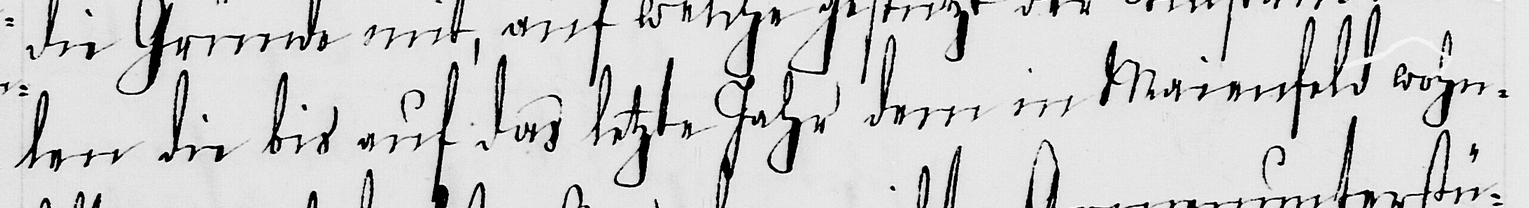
len die bis auf das letzte Jahr dem in Maienfeld wohn¬
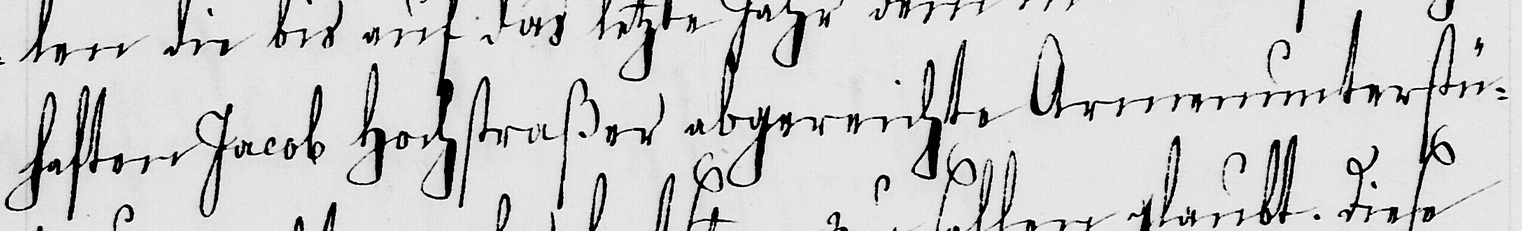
haften Jacob Hochstraßer abgereichte Armenunterstü¬
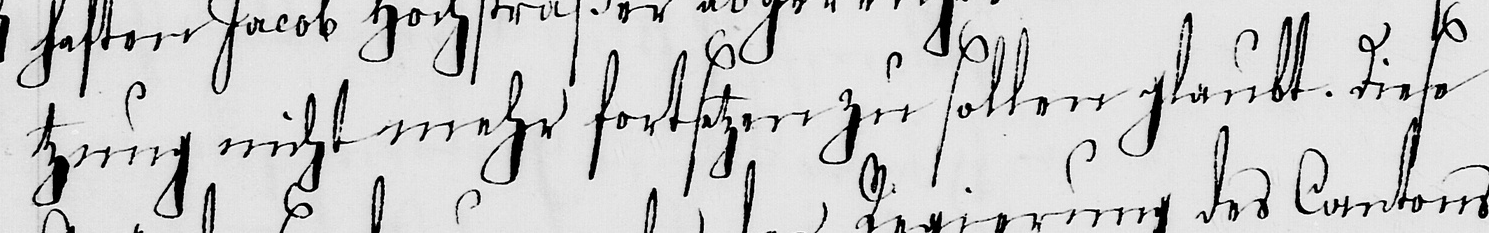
tzung nicht mehr fortsetzen zu sollen glaubt. Diese
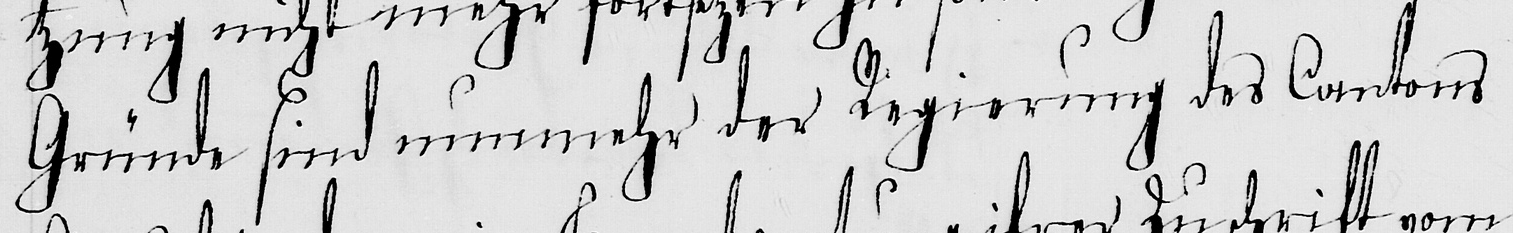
Gründe sind nunmehr der Regierung des Cantons
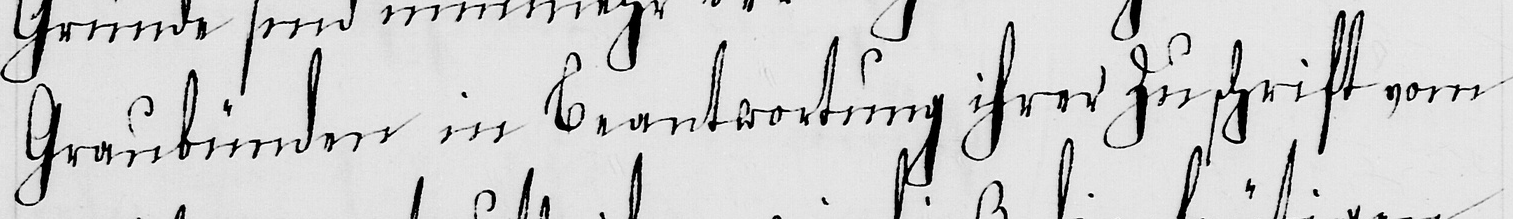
Graubünden in Beantwortung ihrer Zuschrift vom
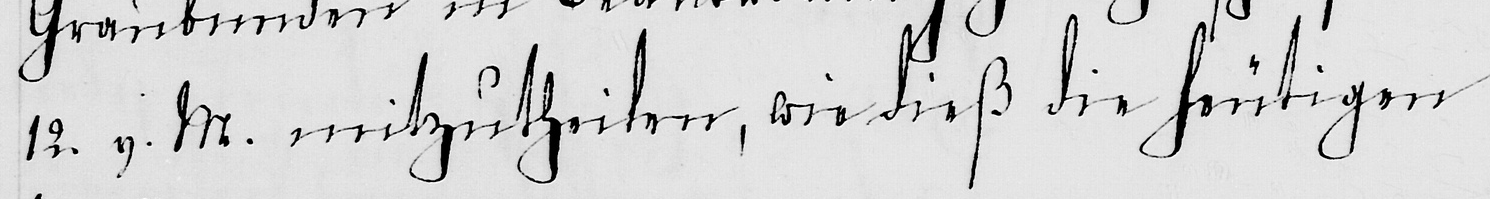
12. v. M. mitzutheilen, wie dieß die heutigen
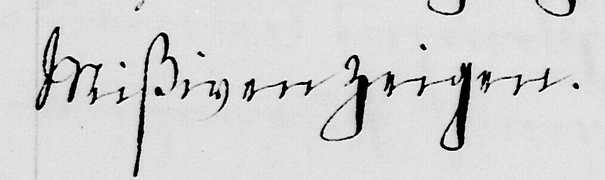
Mißiven zeigen.
